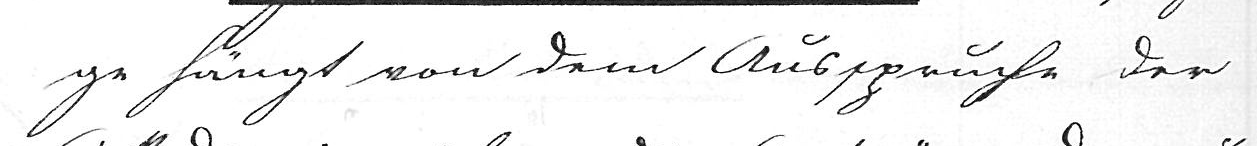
ge hängt von dem Ausspruche der
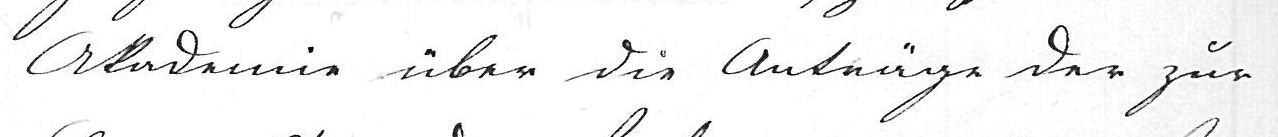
Akademie über die Anträge der zur
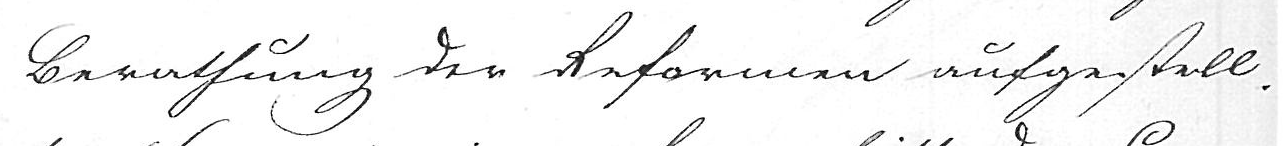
Berathung der Reformen aufgestell-
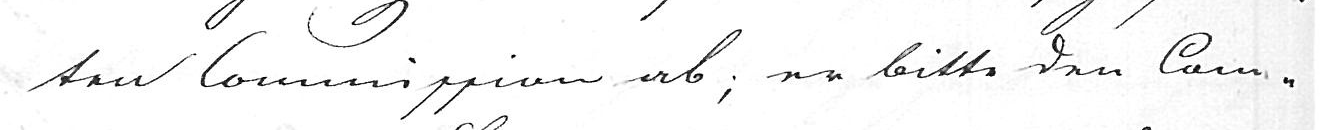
ten Commission ab; er bitte den Com-
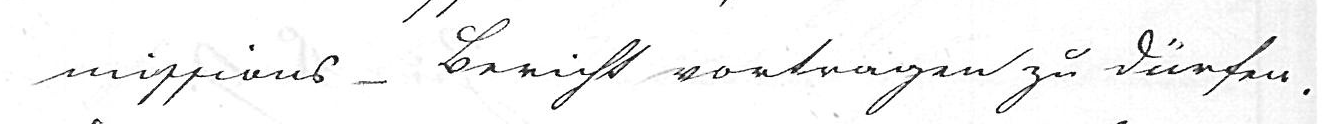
missions-Bericht vortragen zu dürfen.
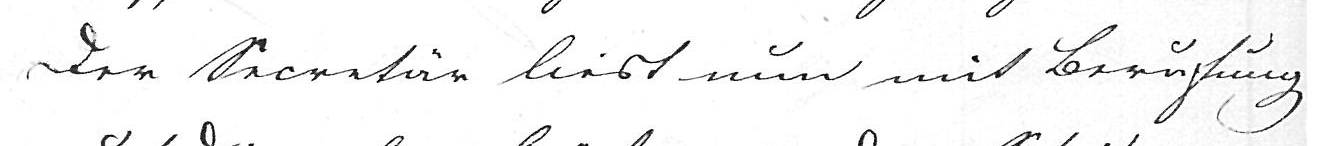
Der Secretär liest nun mit Berufung
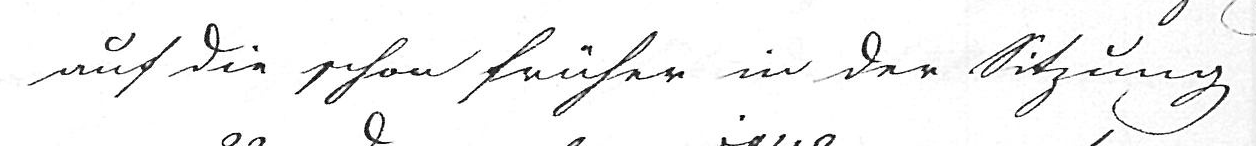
auf die schon früher in der Sitzung
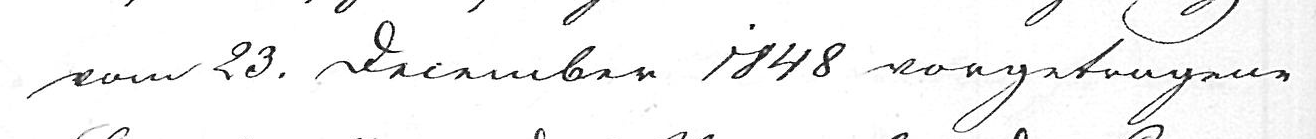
von 23. December 1848 vorgetragene
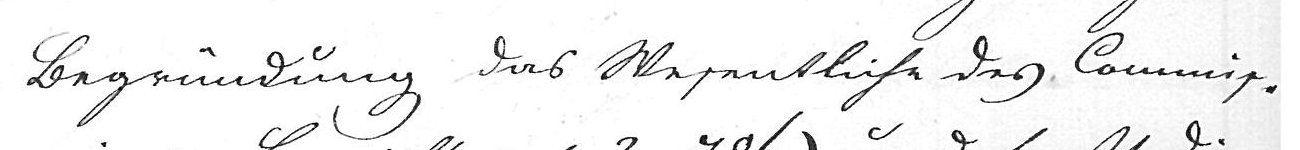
Begründung das Wesentliche des Conmmis-
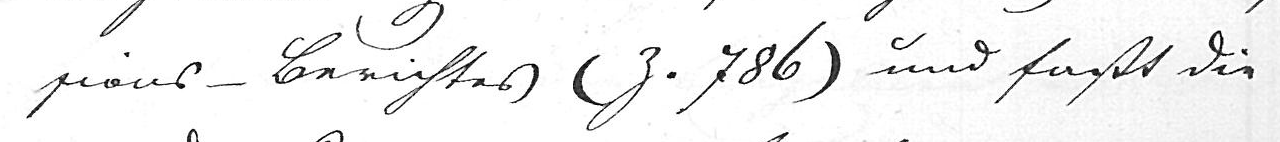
sions-Berichtes (Z. 786) und faßt die
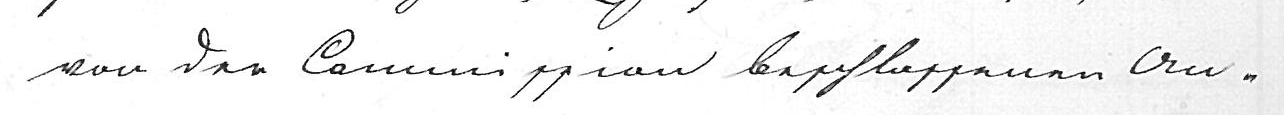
von der Commission beschlossenen An-
